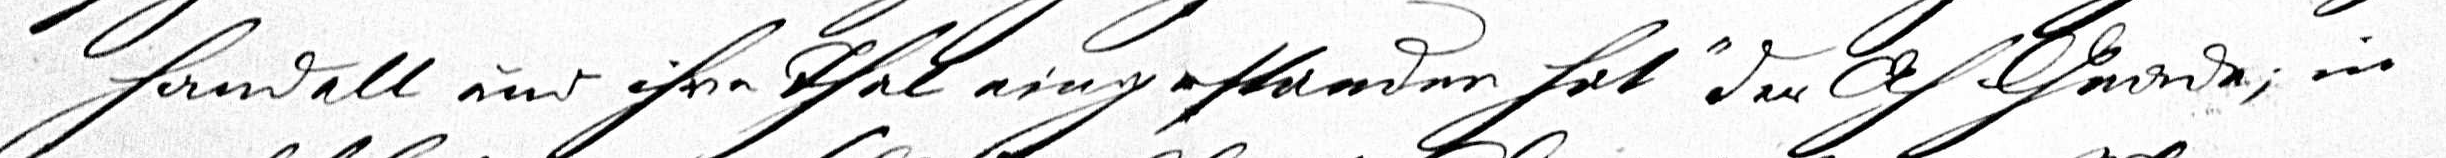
handelt und ihre That eingestanden hat“ der Ah Gnade; in
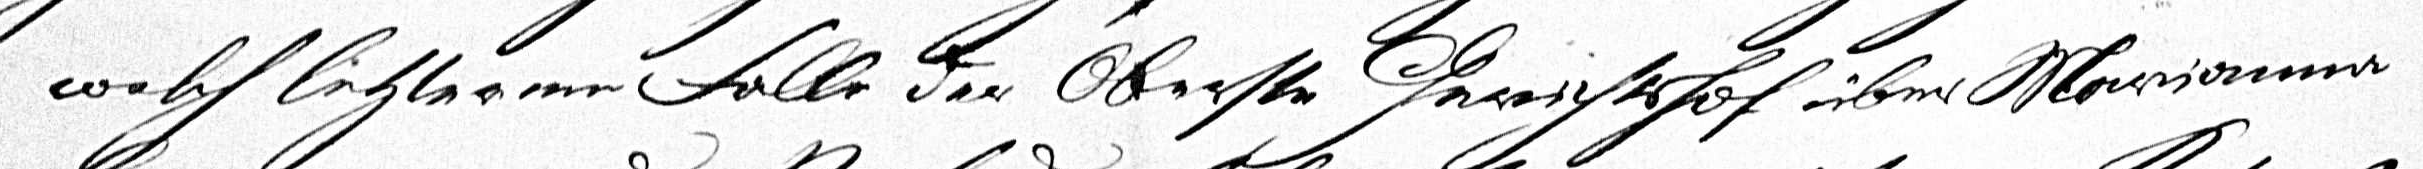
welch letzteren Falle der Oberste Gerichtshof über Marianna
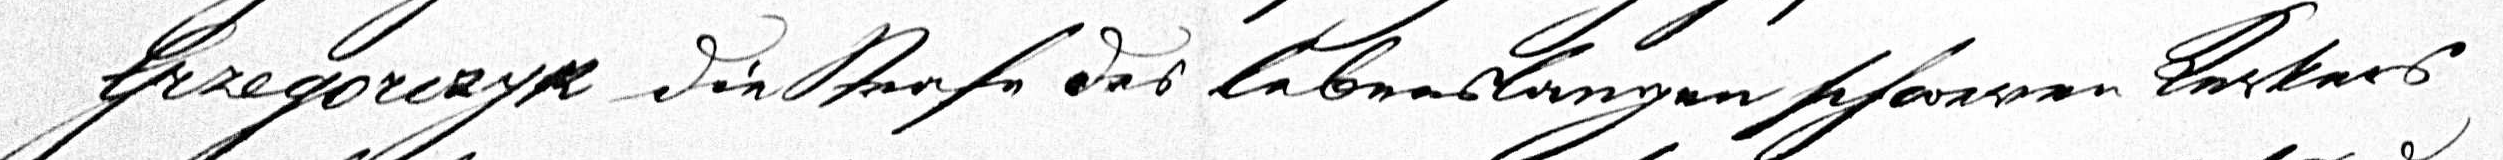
Grzegorczyk die Strafe des lebenslangen schweren Kerkers
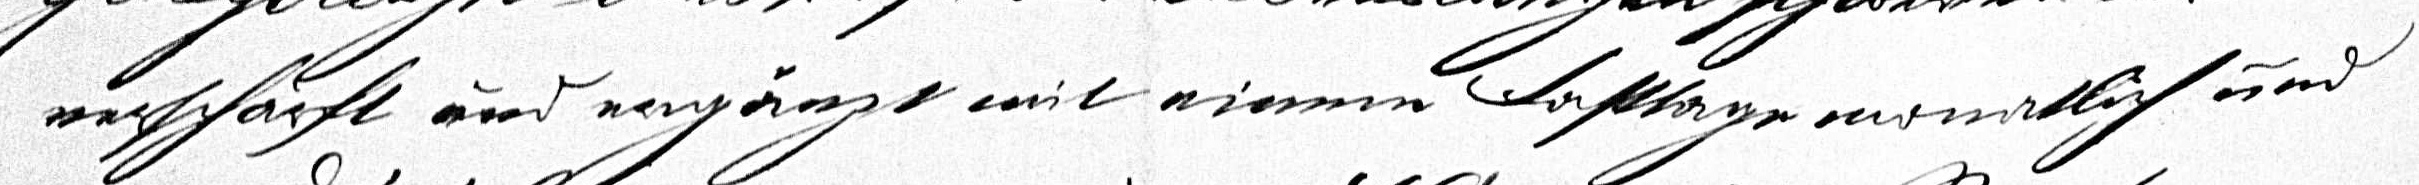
verschärft und ergänzt mit einem Fasttage monatlich und
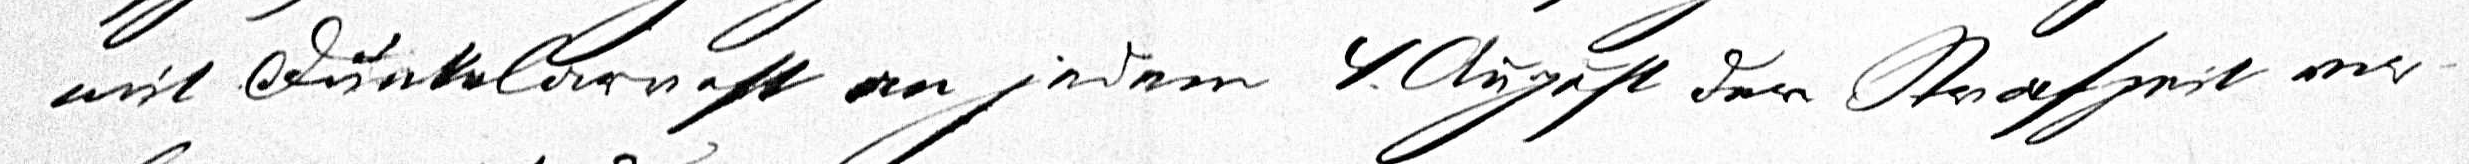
mit Dunkelarrest an jedem 4. August der Strafzeit ver¬
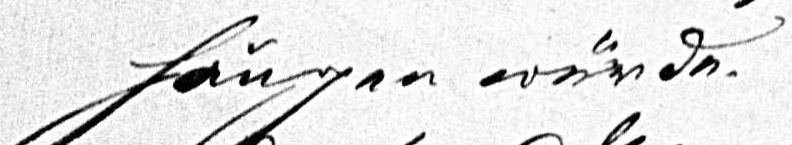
hängen würde.
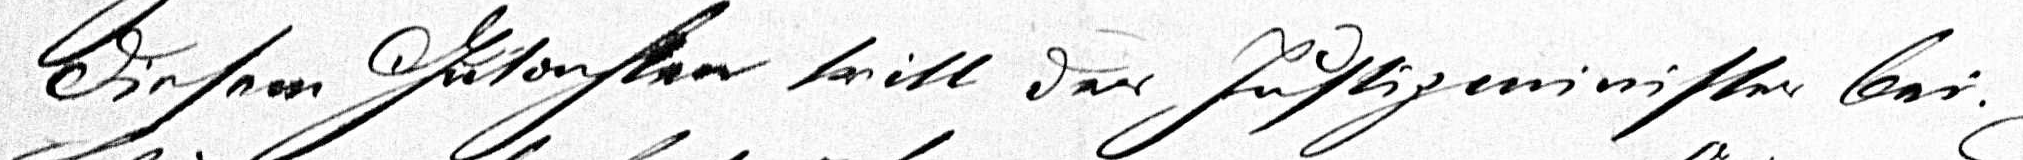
Diesem Gutachten tritt der Justizminister bei.
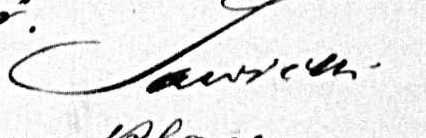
Sawicki
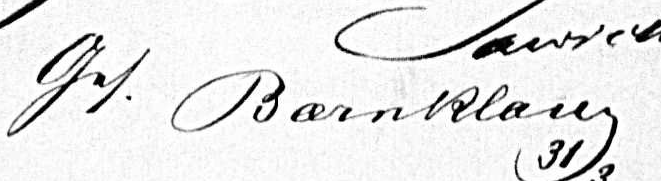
Ges. Barnklanz
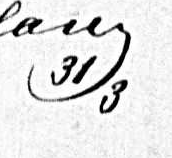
31/3
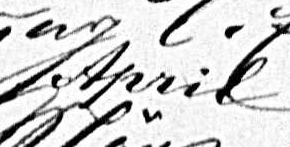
April
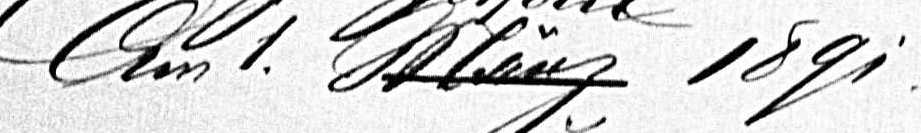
Am 1. 1891
